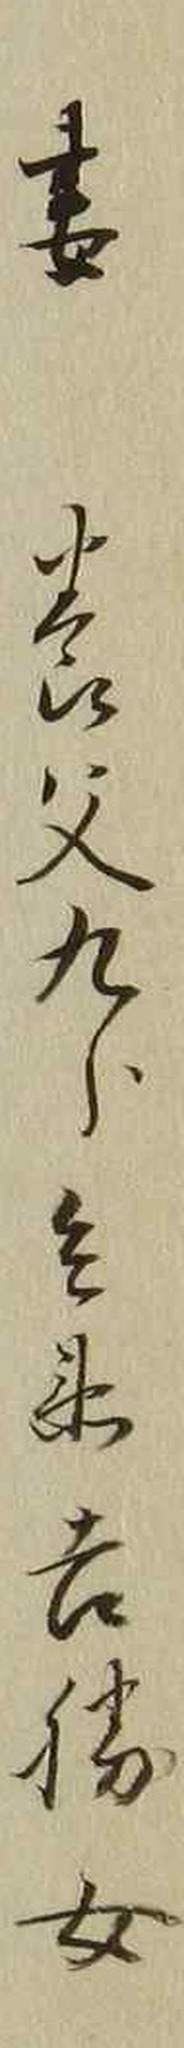妻養父九郎兵衛吉勝女
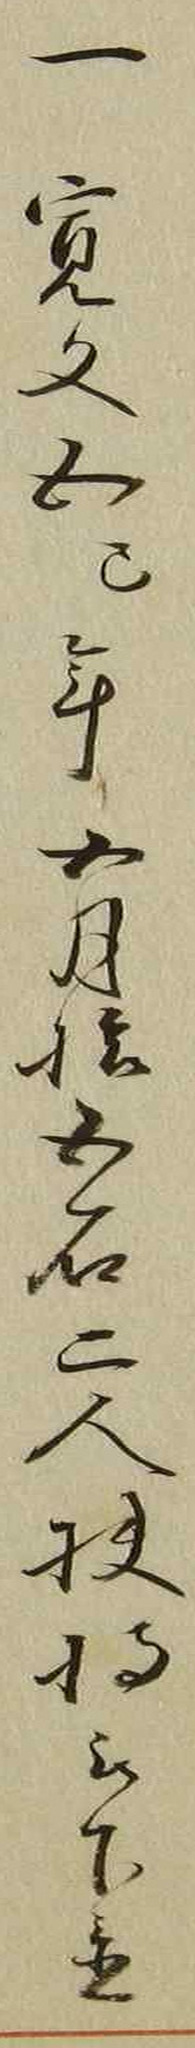一寛文五巳年五月拾五石二人扶持被下置
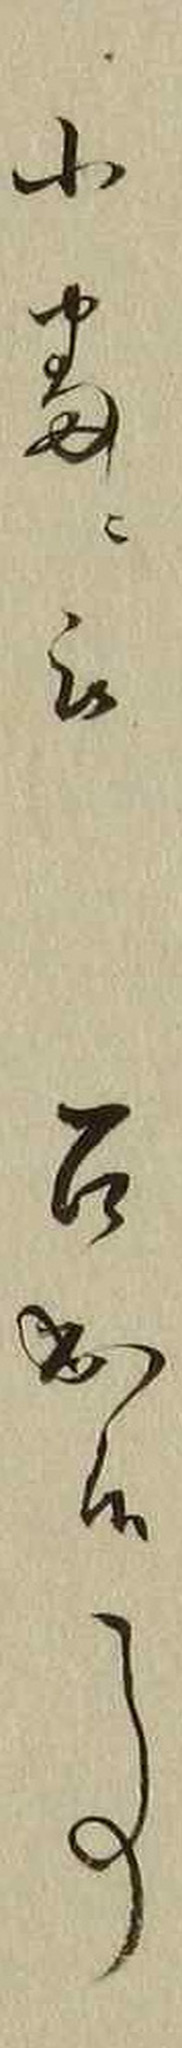小番ニ被召出候事
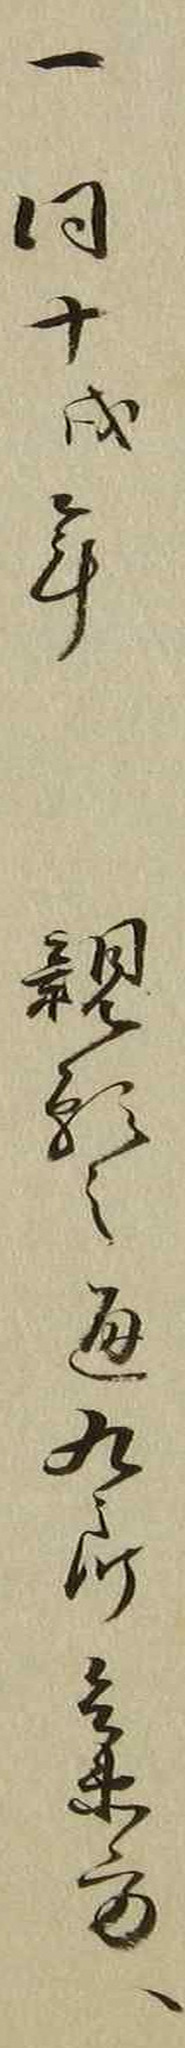一同十戌年親願之通九郎兵衛方へ
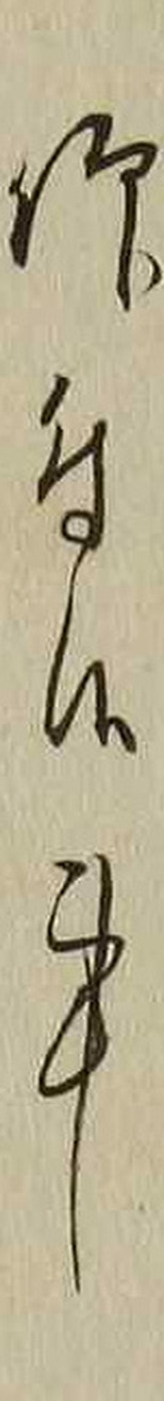仰付候事
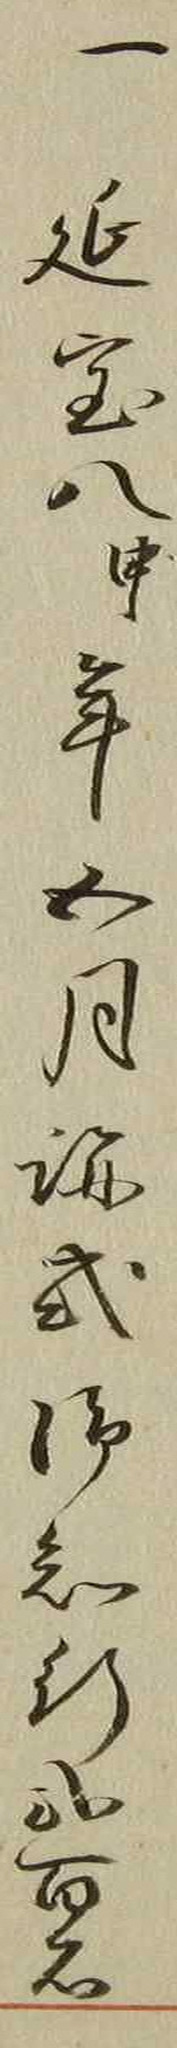一延宝八申年五月跡式御知行弐百石
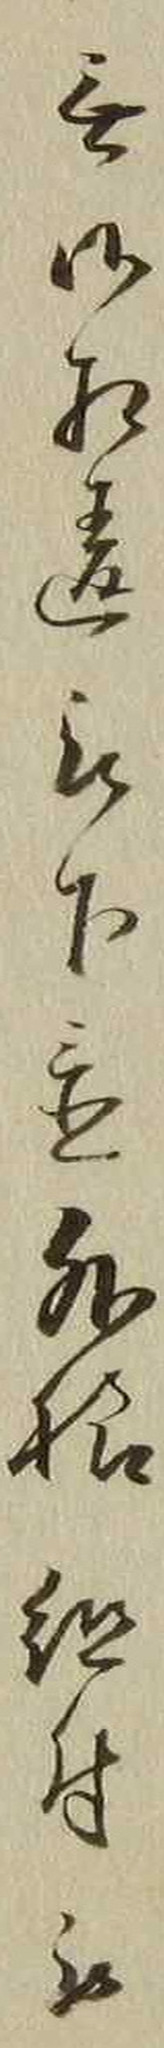無御相違被下置外様組付被
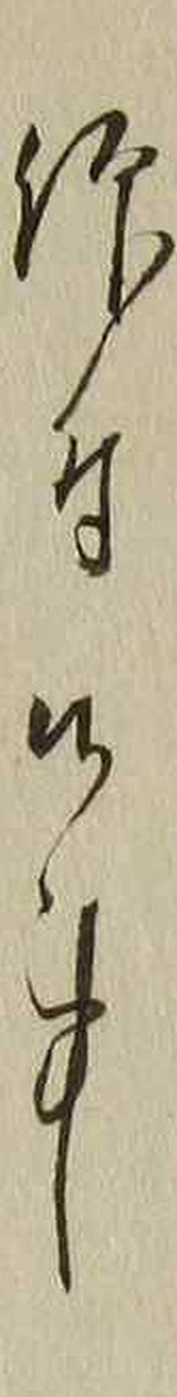仰付候事
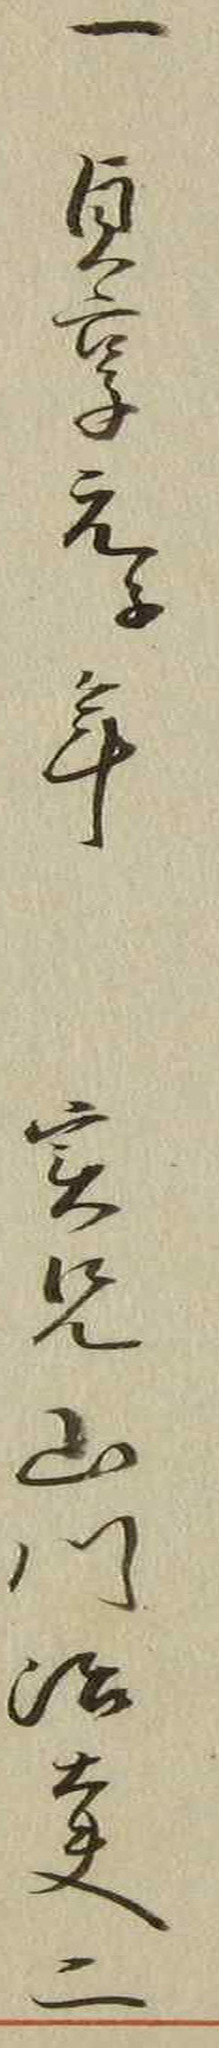一貞享元子年実兄山川治大夫二
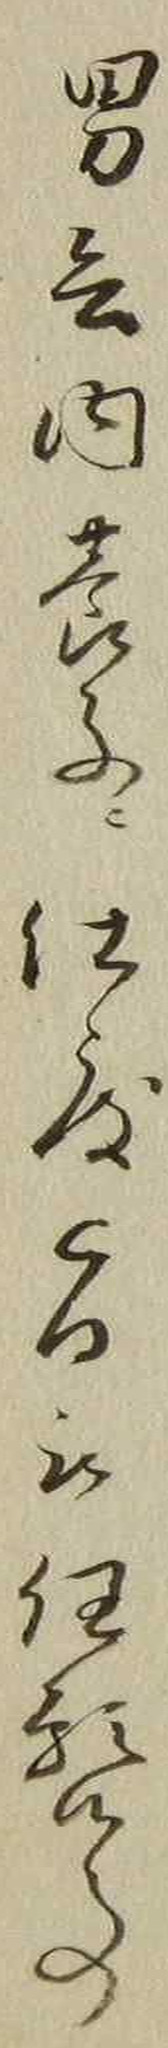男言内養子ニ仕度旨被任願候事
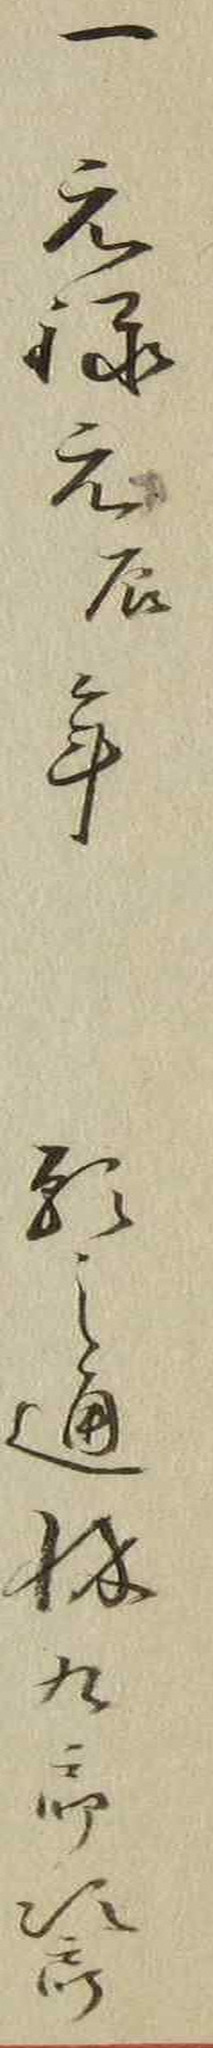一元禄元辰年願之通孫九郎次郎
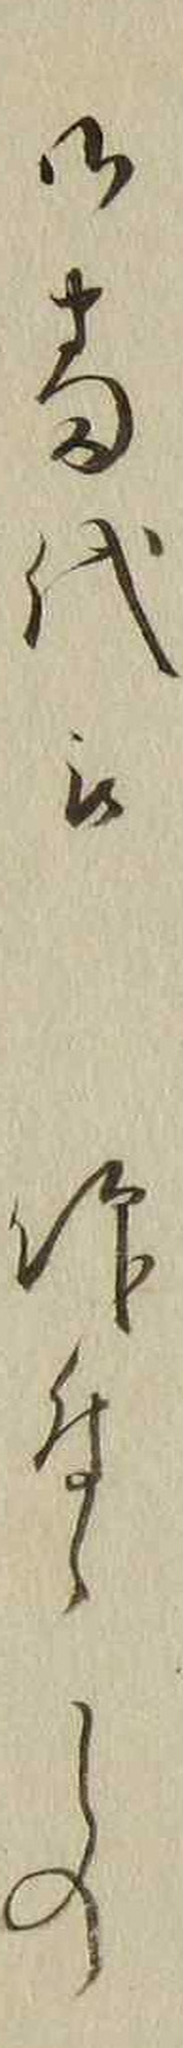御番代被仰付候事
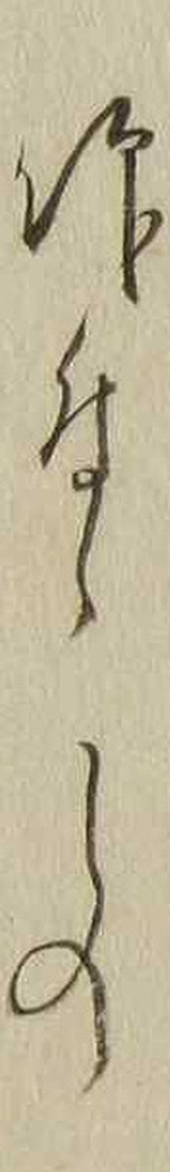仰付候事
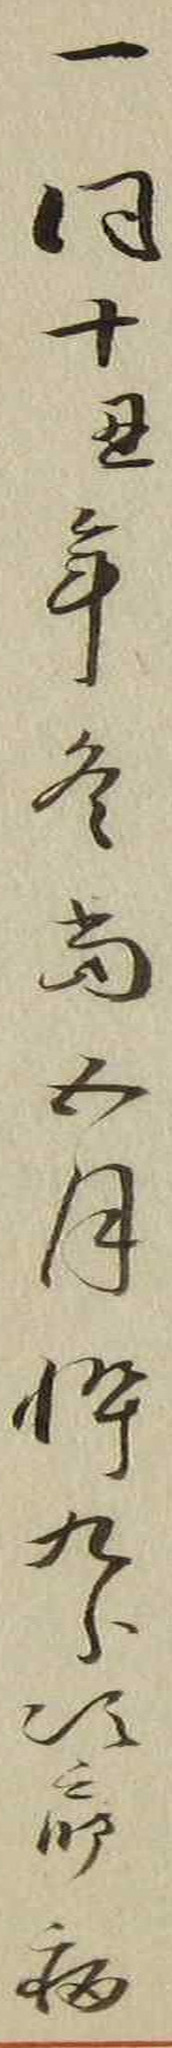一同十丑年冬当五月忰九郎次郎病
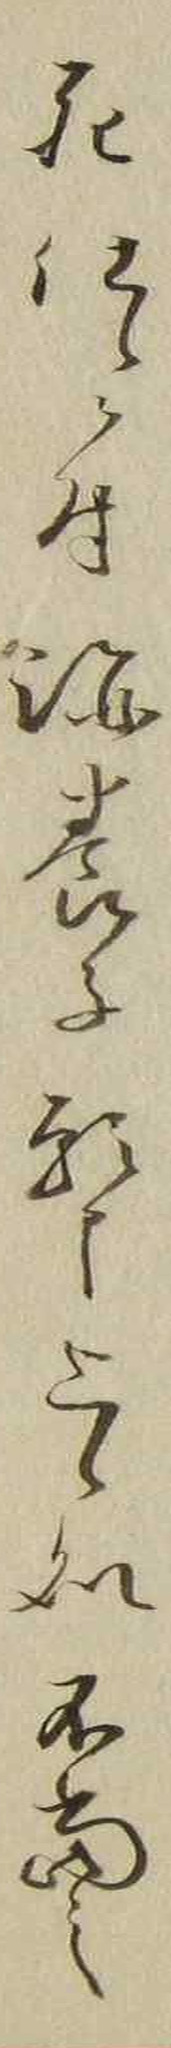死仕候ニ付跡養子願申上候処不当之

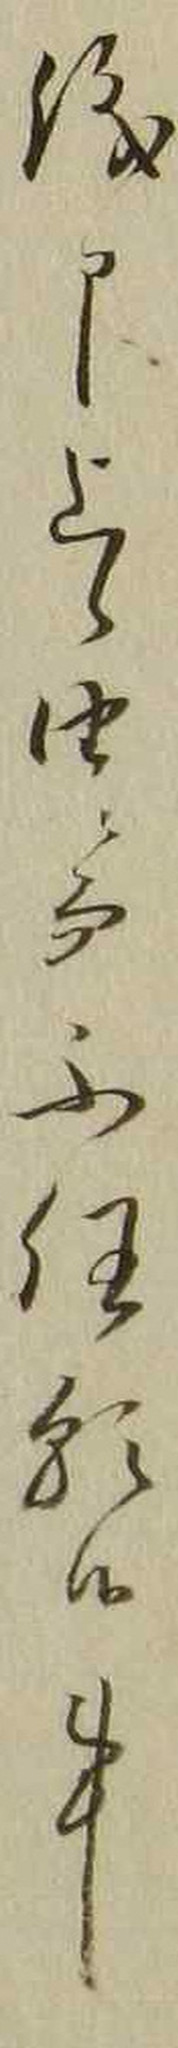儀申上候由ニ而不任願候事
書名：諸士系譜　巻之32　い之部32
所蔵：会津若松市立会津図書館
